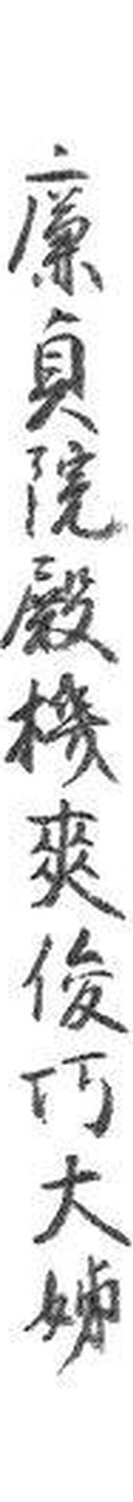廉貞院殿機爽俊巧大姉
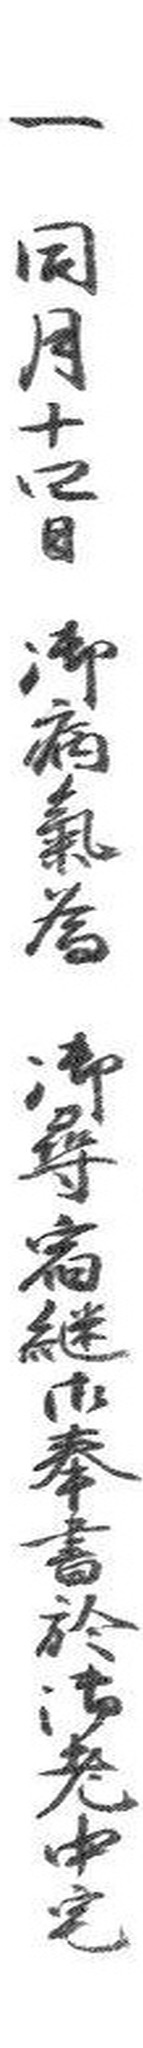一同月十四日御病気為御尋宿継御奉書於御老中宅
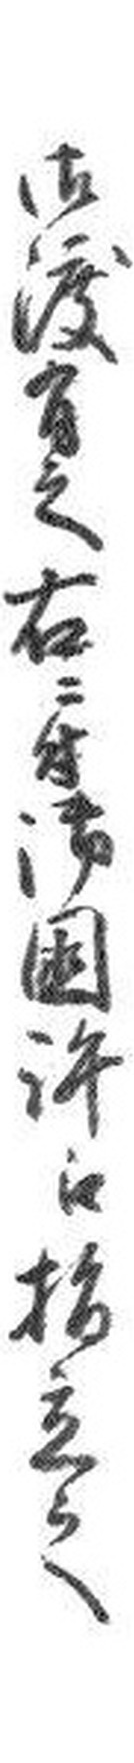御渡有之右ニ付御国許江指立之
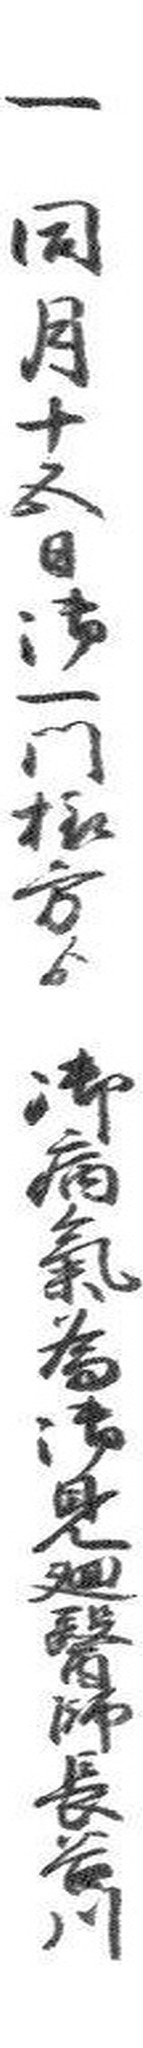一同月十五日御一門様方ゟ御病気為御見廻医師長谷川
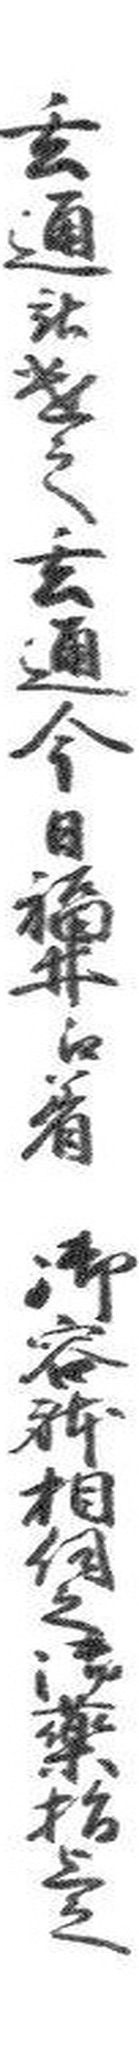玄通被遣之玄通今日福井江着御容体相伺之御薬指上之
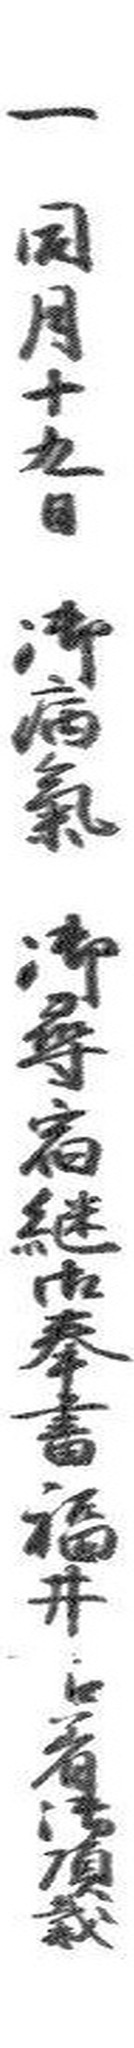一同月十九日御病気御尋宿継御奉書福井江着御頂戴
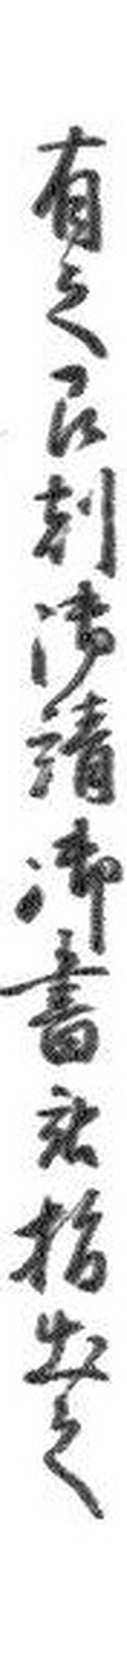有之即刻御請御書被指出之
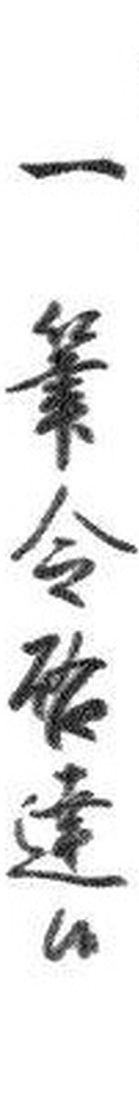一筆令啓達候
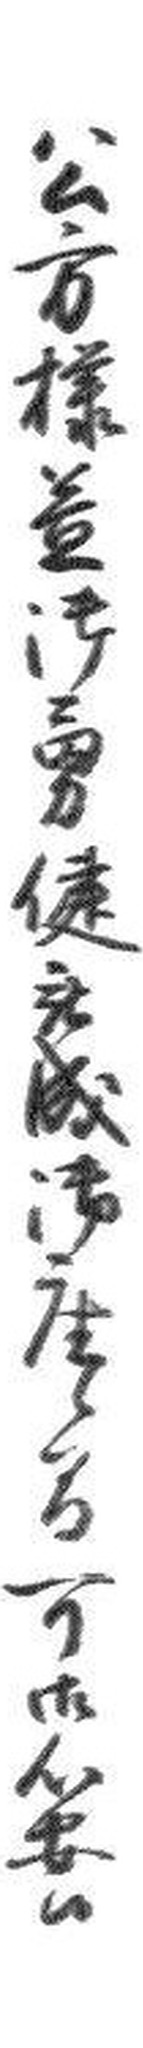公方様益御勇健被成御座候間可御心安候
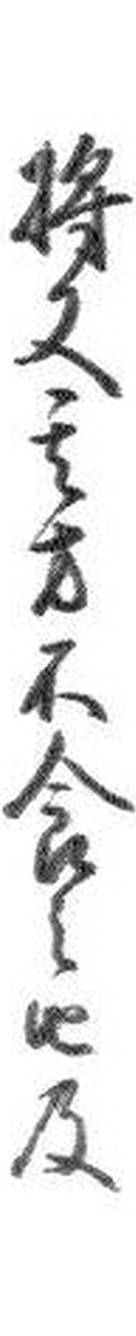将又其方不食之由及
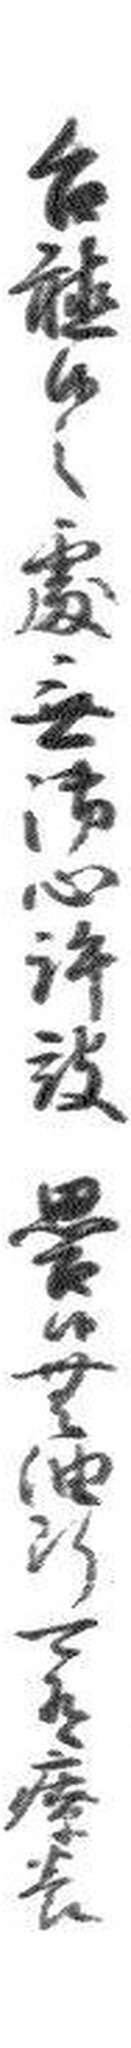台聴候之処無御心許被思召候無油断可有療養
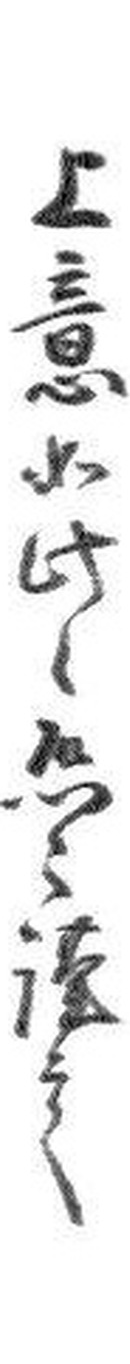上意如此候恐々謹言
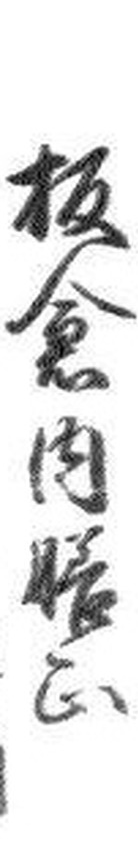板倉内膳正
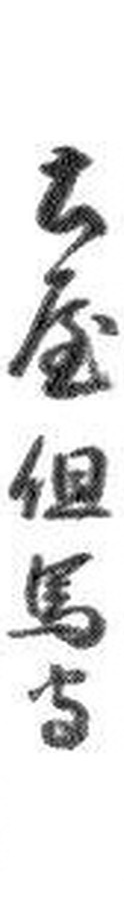土屋但馬守
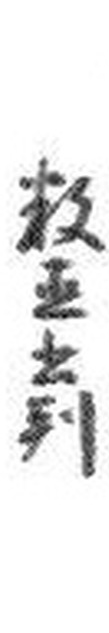数直書判

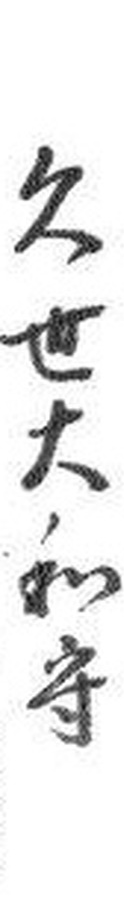久世大和守
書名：家譜 八 光通公 従寛文十年到同十二年
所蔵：福井県文書館 Fukui Prefectural Archives
